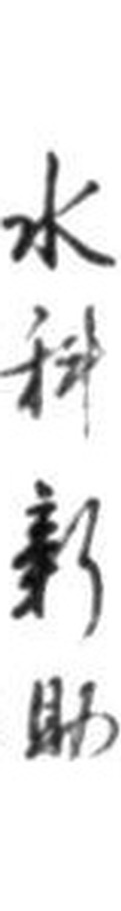水科新助
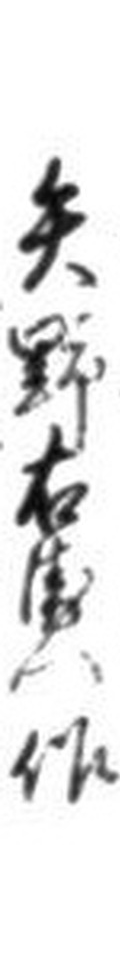矢野右衛門作
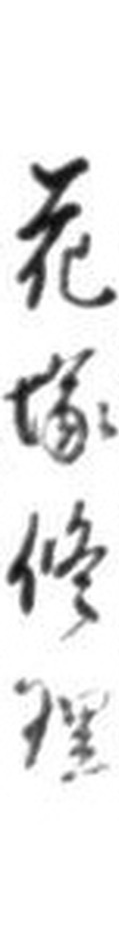花塚修理
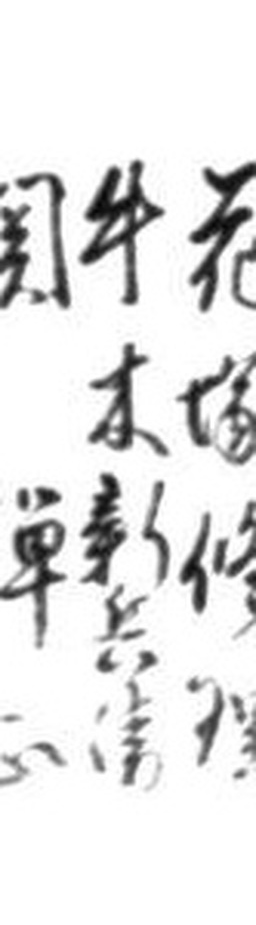関弾正
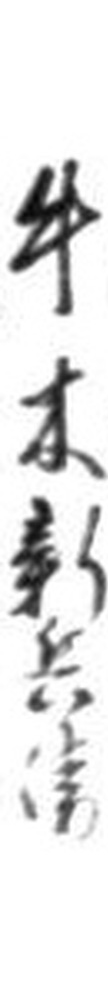牛木新兵衛
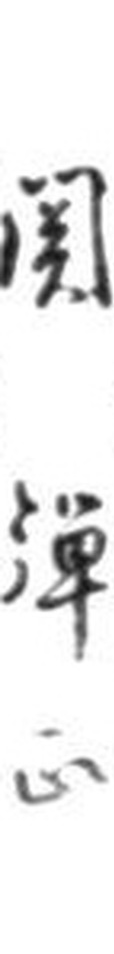関弾正
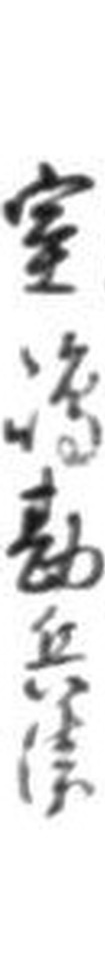室嶋勘兵衛
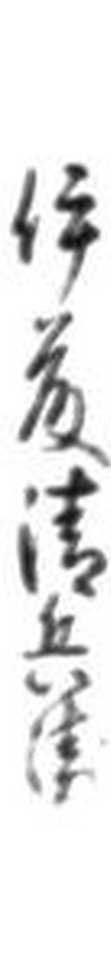伊藤清兵衛
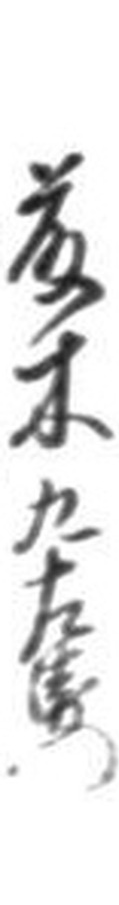藤木九左衛門
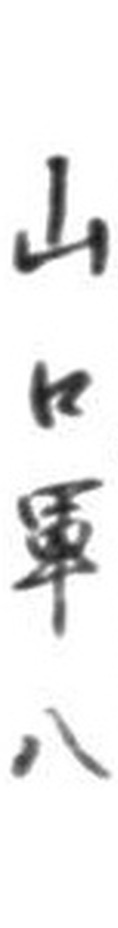山口軍八
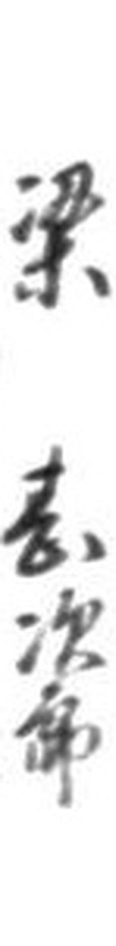梁甚次郎
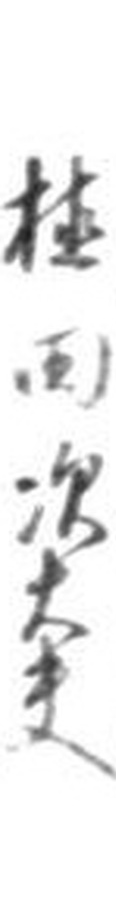植田次大夫
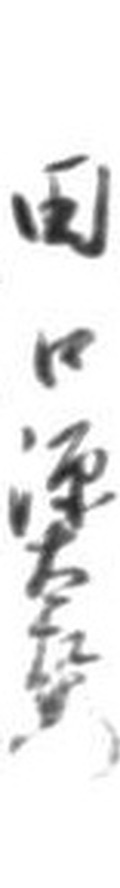田口源太左衛門
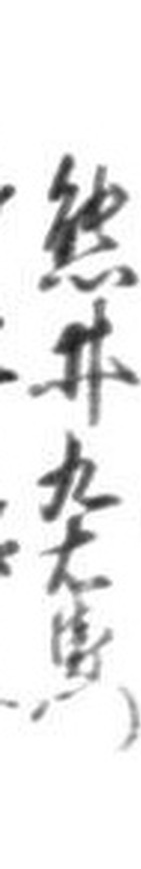熊井九右衛門
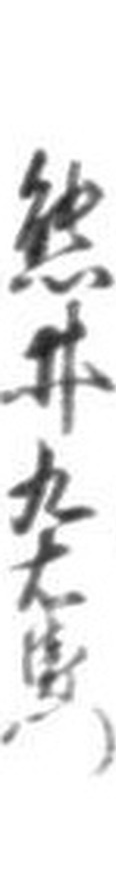熊井九右衛門
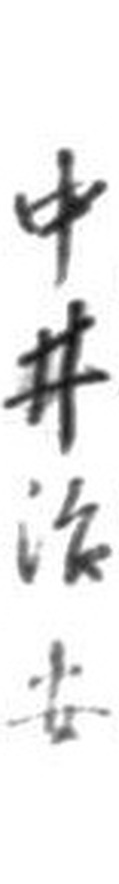中井治安
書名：家譜 二 忠直公 従文禄四年到慶安四年
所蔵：福井県文書館 Fukui Prefectural Archives
